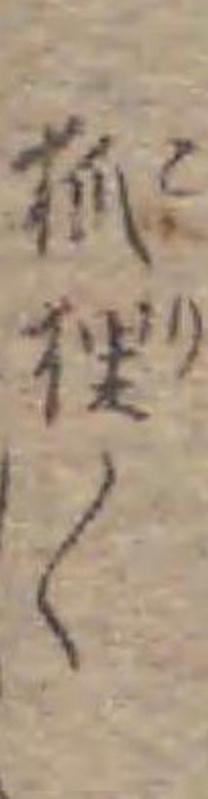狐狸〳〵
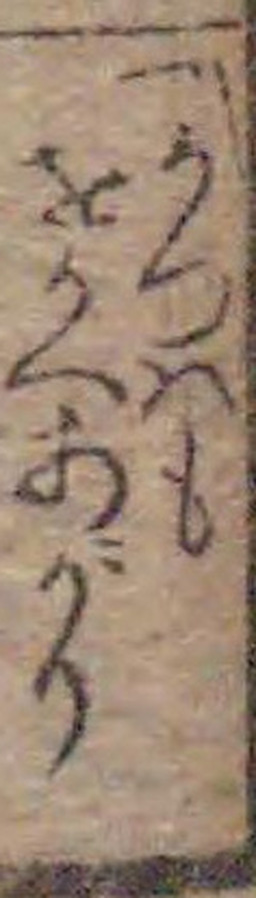をかへあがり
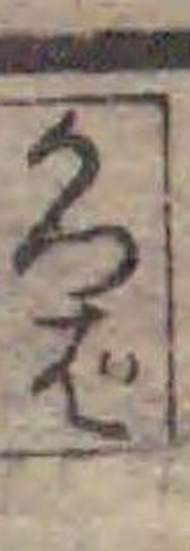かつは

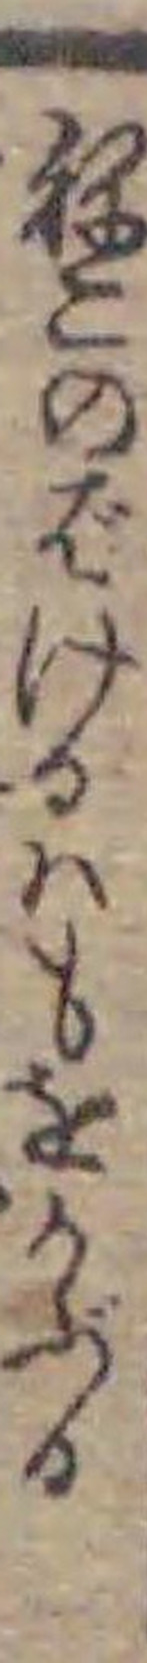ねこのばけるはもをかぶる
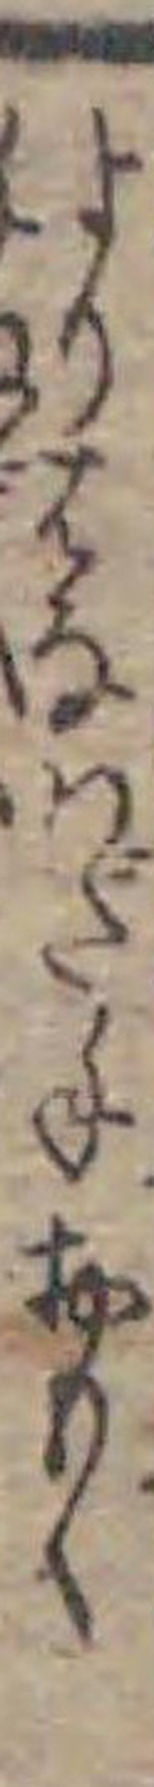よりはなはだ手おもく
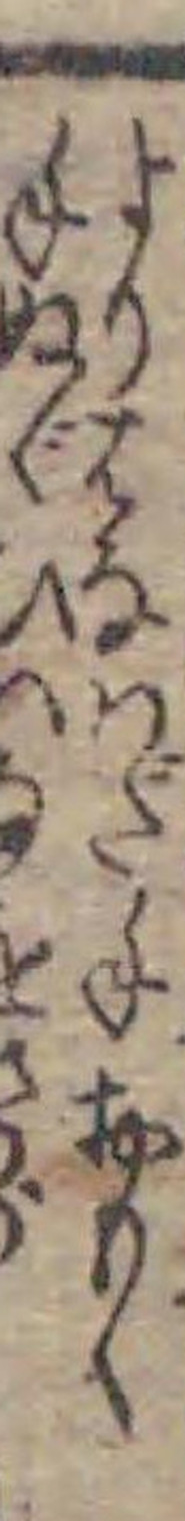よりはなはだ手おもく
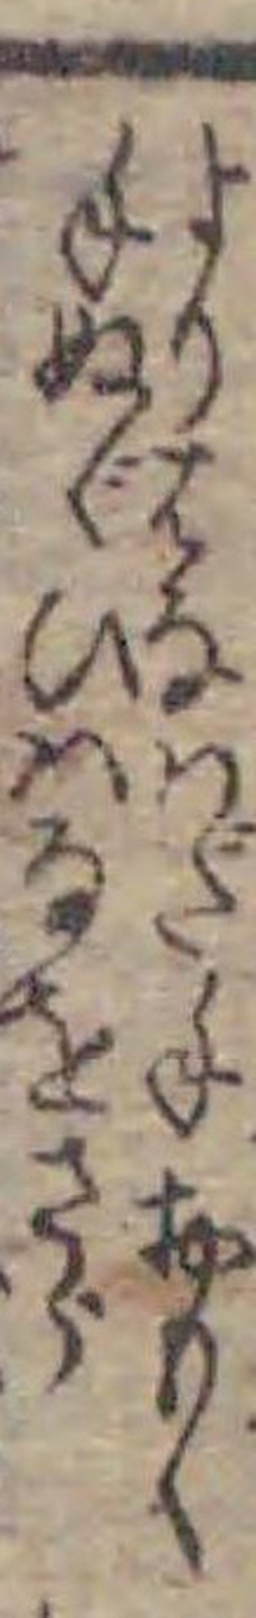手ぬぐひはなをさら
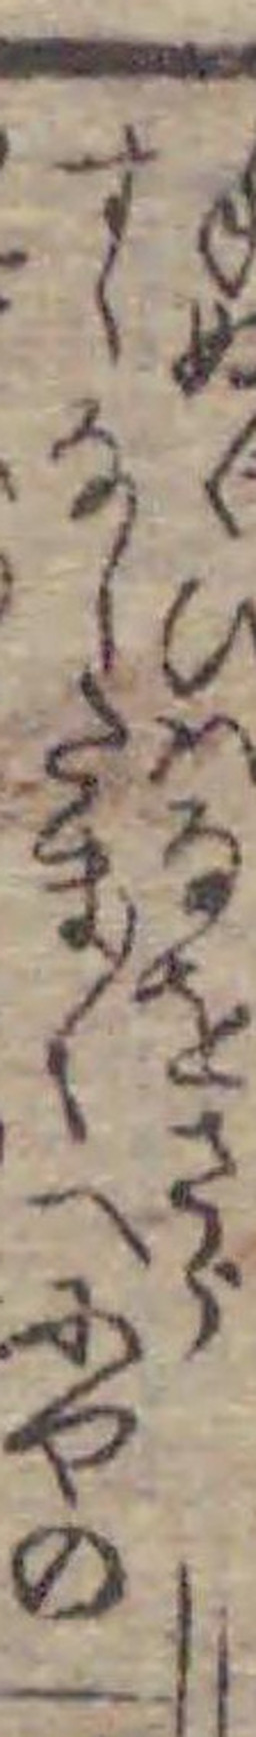すくなしたま〳〵へにやの
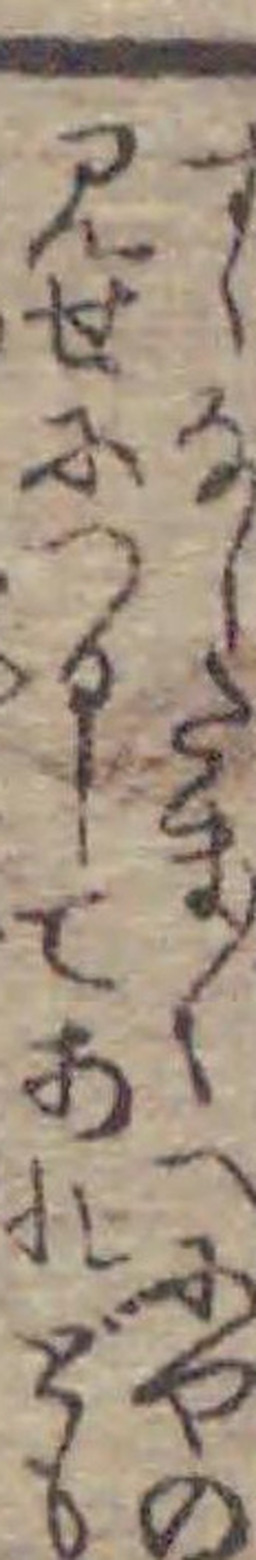みせにつるしてあれども
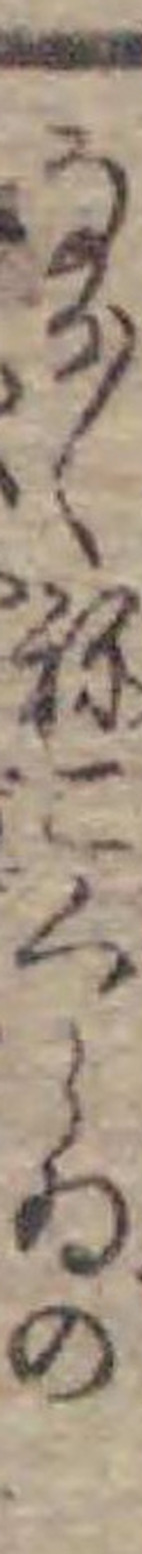なか〳〵ねこくらゐの
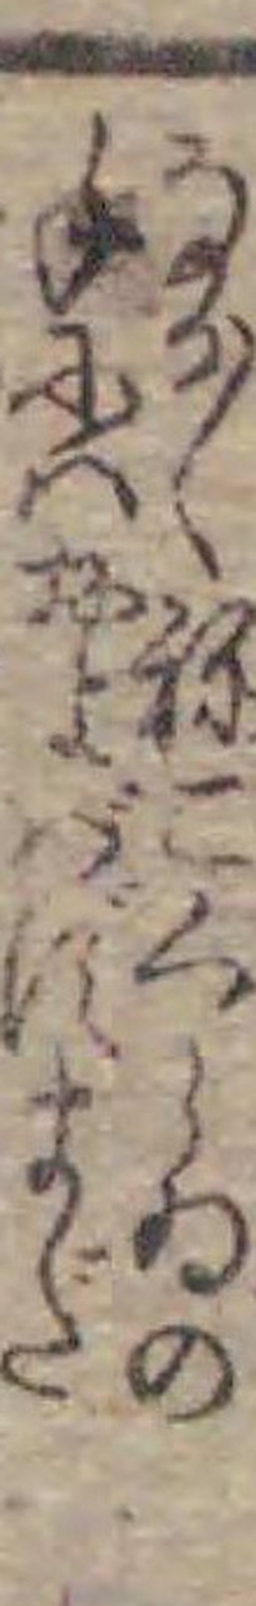手にはおよばづまだ
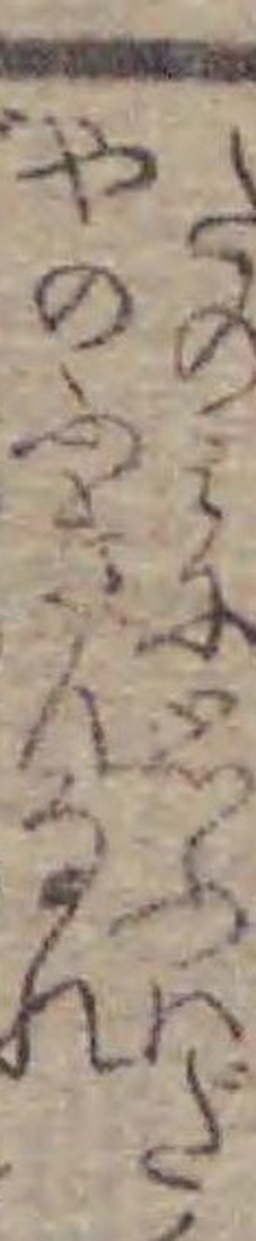やのふきんなれ
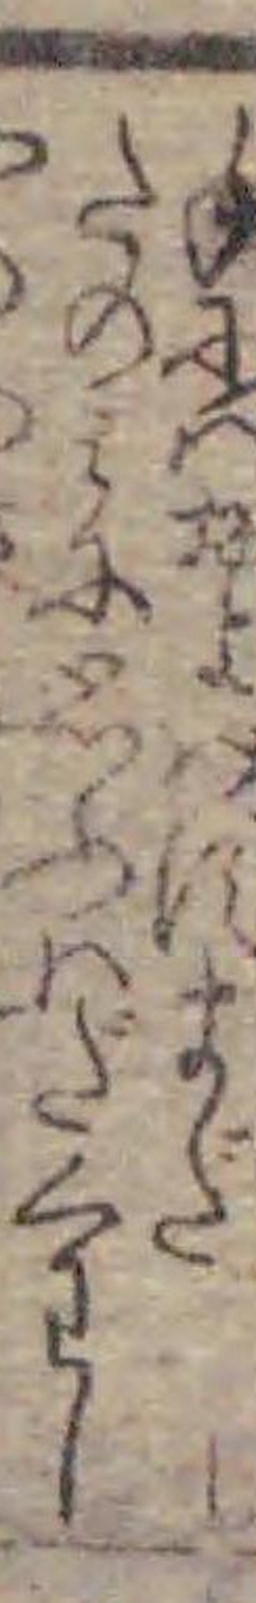たのみに思ふはだくわし
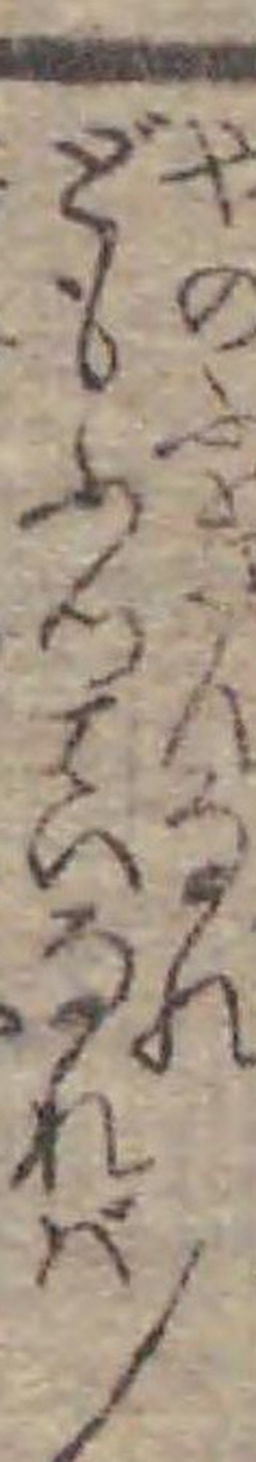どもふつていなれば
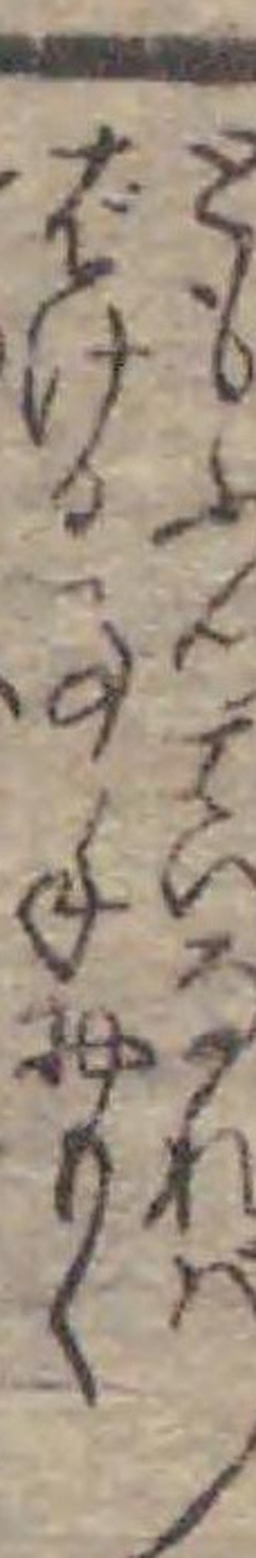ばける事手おもく
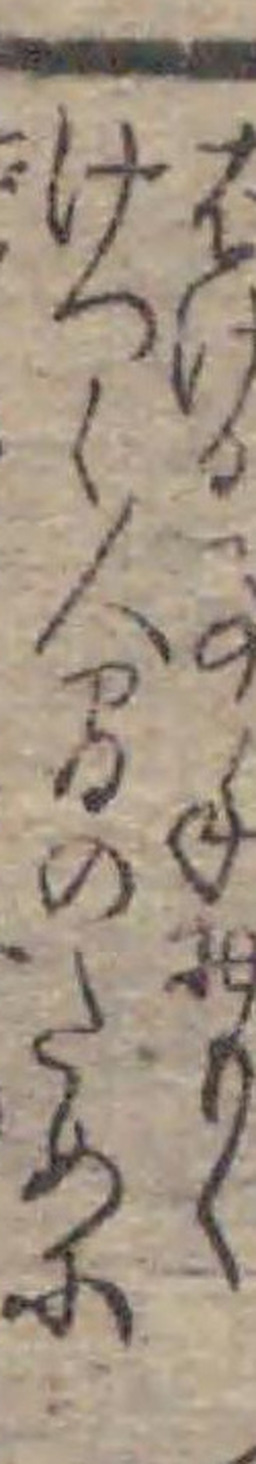けつく人間のために
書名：怪物つれつれ草 : 2巻
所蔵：国立国会図書館 National Diet Library, JAPAN
